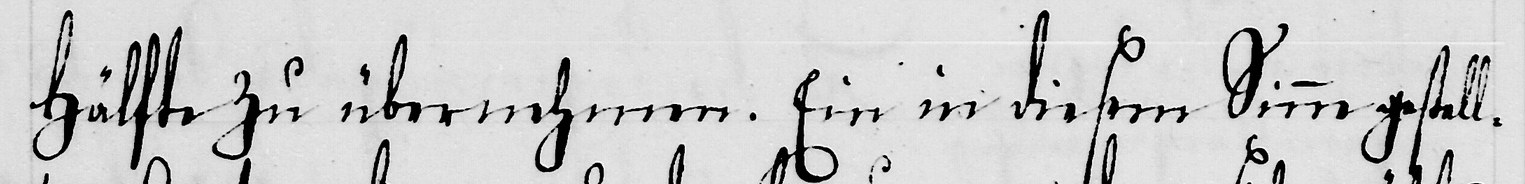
Hälfte zu übernehmen. Ein in diesem Sinne geste¬
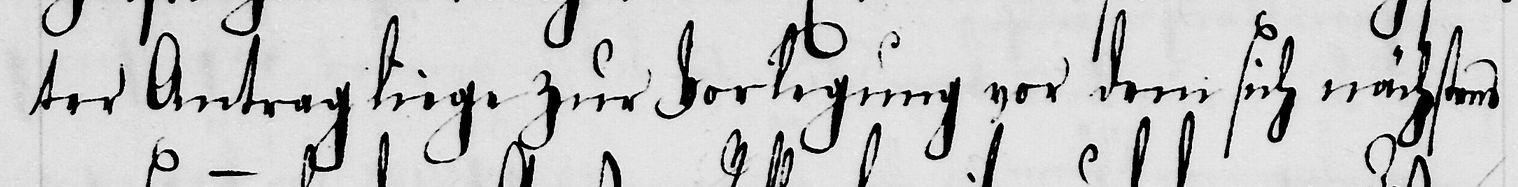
ter Antrag liege zur Vorlegung vor dem sich nächstens
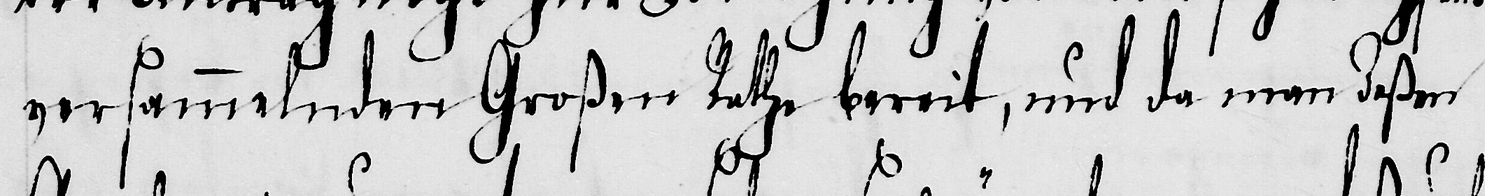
versammelnden Großen Rathe bereit, und da man deßen
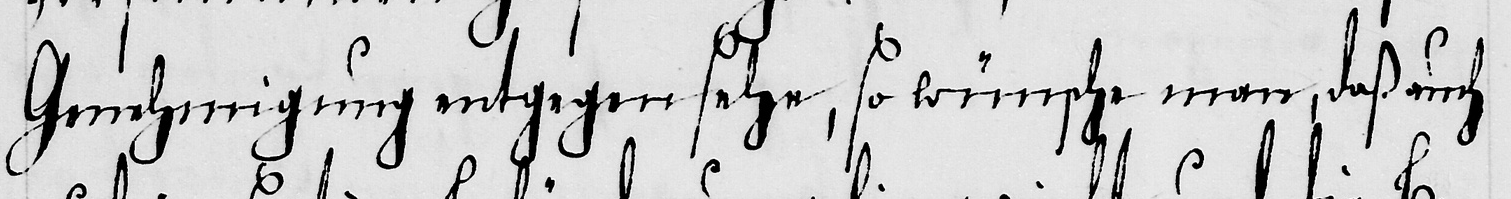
Genehmigung entgegen sehe, so wünsche man, daß auch
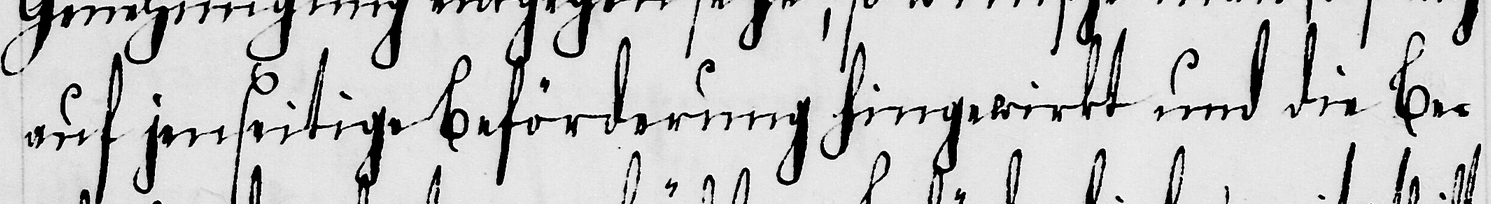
auf jenseitige Beförderung hingewirkt und die Be¬
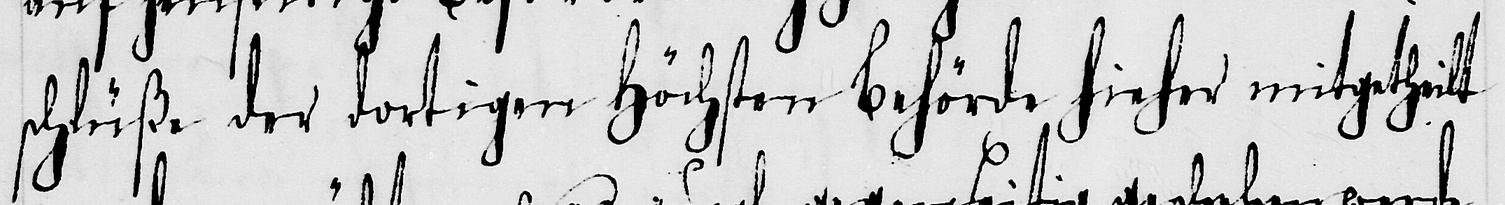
schlüße der dortigen Höchsten Behörde hieher mitgetheilt
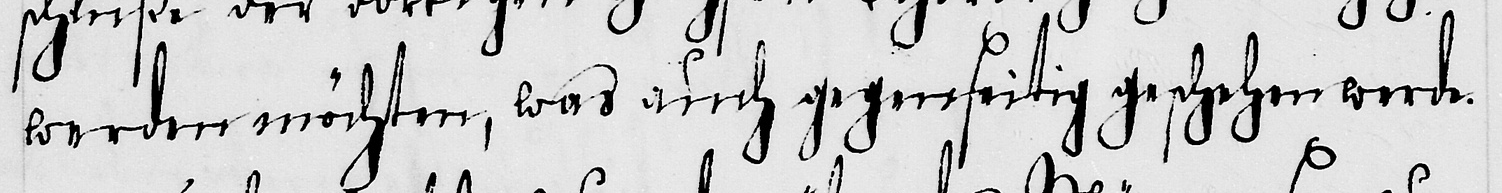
werden möchten, was auch gegenseitig geschehen werde.
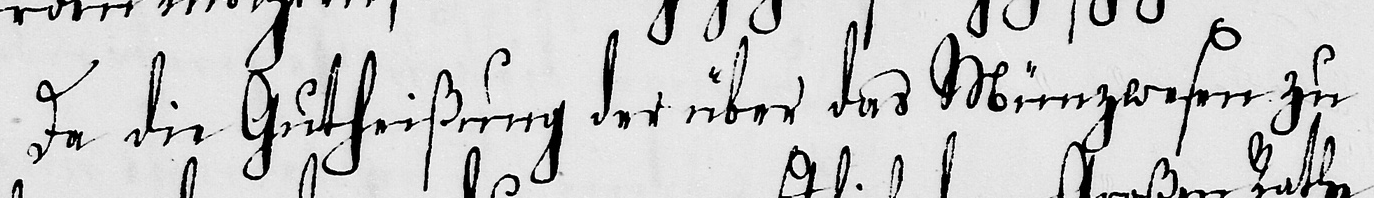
Da die Gutheißung der über das Münzwesen zu
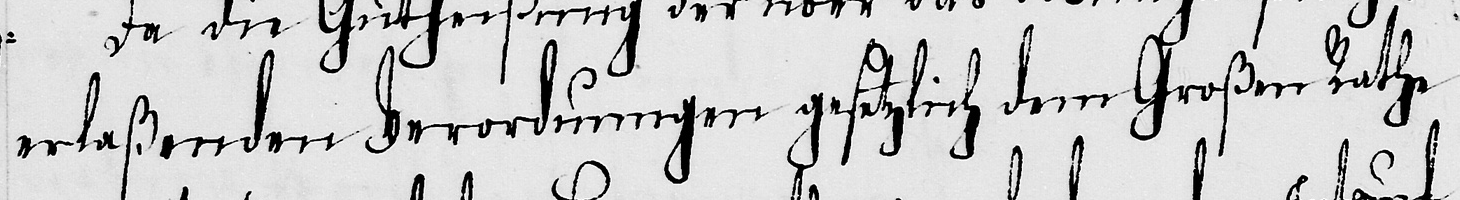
erlaßenden Verordnungen gesetzlich dem Großen Rathe
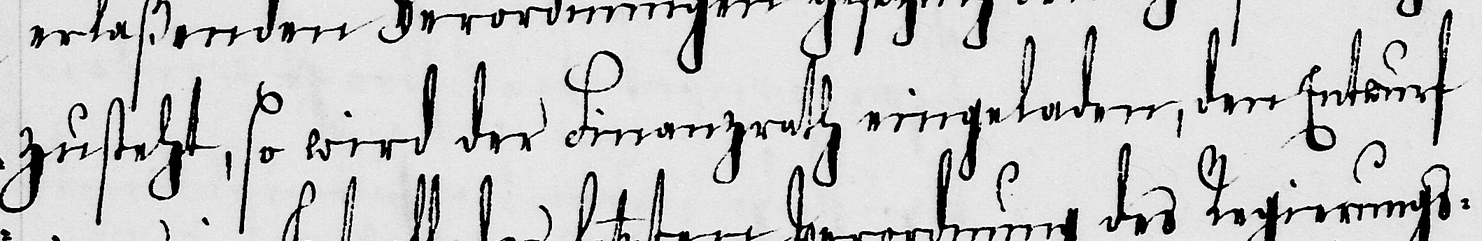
zusteht, so wird der Finanzrath eingeladen, den Entwurf
